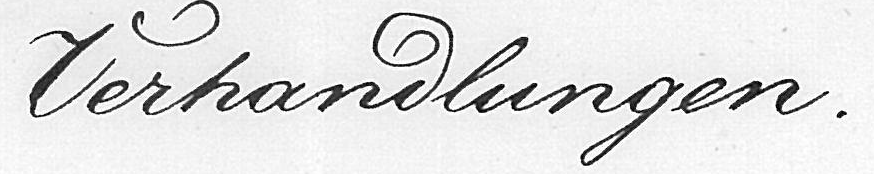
Verhandlungen.
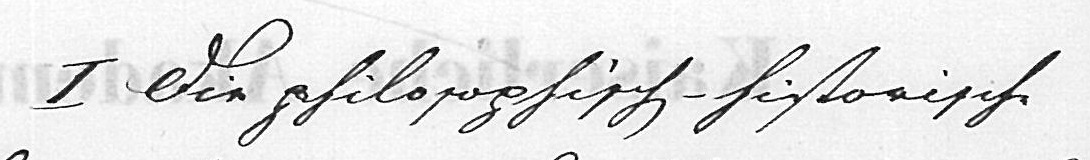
I. Die philosophisch-historische
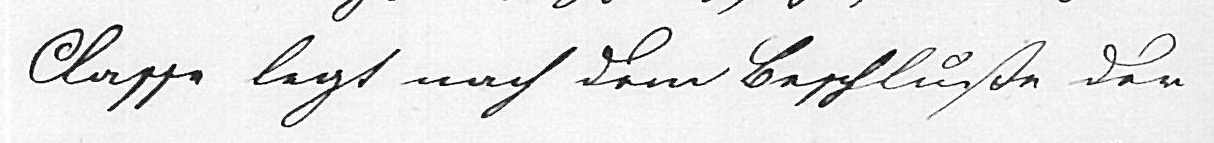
Classe legt nach dem Beschluße der
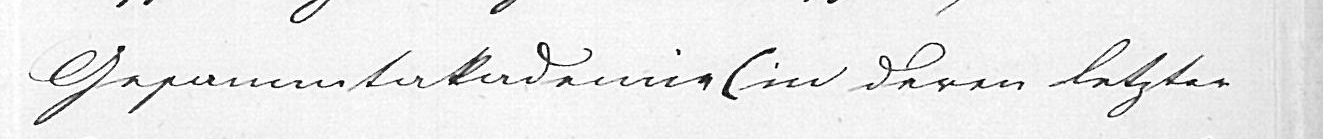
Gesammtakademie (in deren letzter
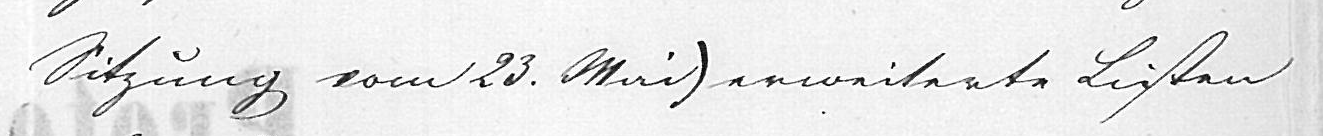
Sitzung von 23. Mai) erweiterte Listen
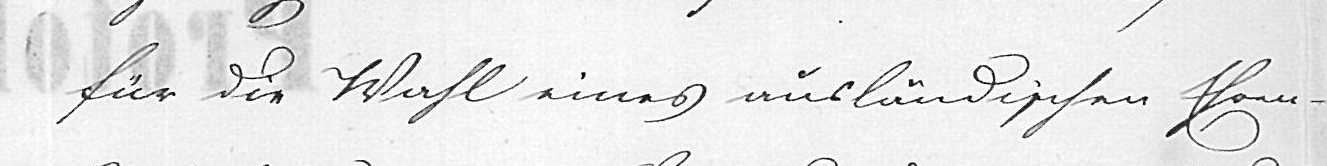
für die Wahl eines ausländischen Ehren-
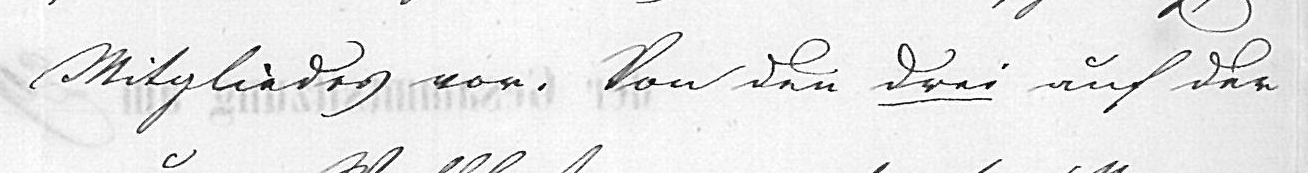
Mitgliedes vor. Von den drei auf der
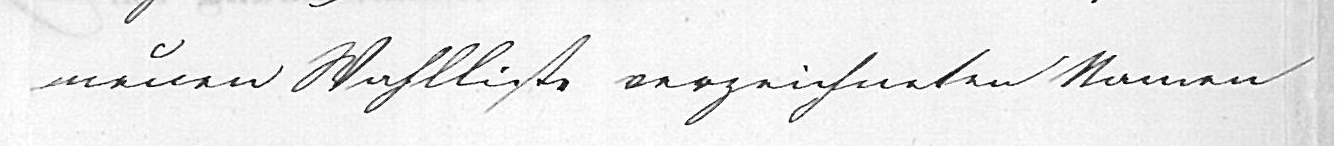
neuen Wahlliste verzeichneten Namen
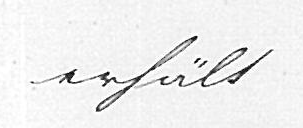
erhält
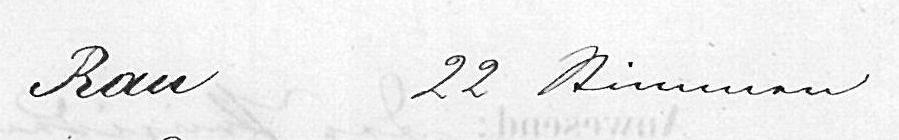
Rau 22 Stimmen
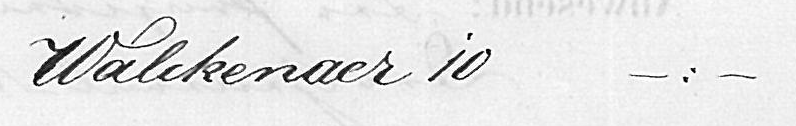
Walkenaer 10 -:-
